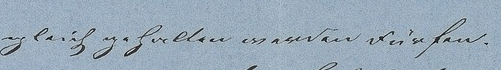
gleich gehalten werden dürfen.
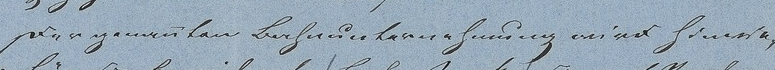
Der genannten Bahnunternehmung wird hinwie-
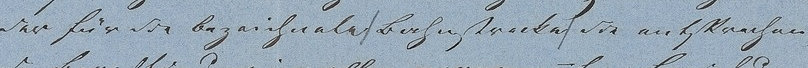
der für die bezeichnete Bahnstrecke die entsprechen-
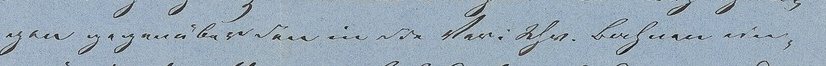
gen gegenüber den in die Ver: Schw.Bahnen ein-
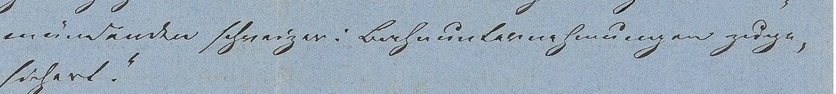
mündenden schweizer: Bahnunternehmungen zuge-
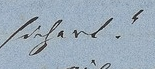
sichert.»
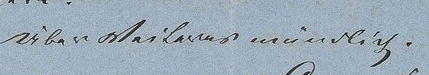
Über Weiteres mündlich.
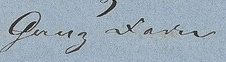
Ganz Dein
